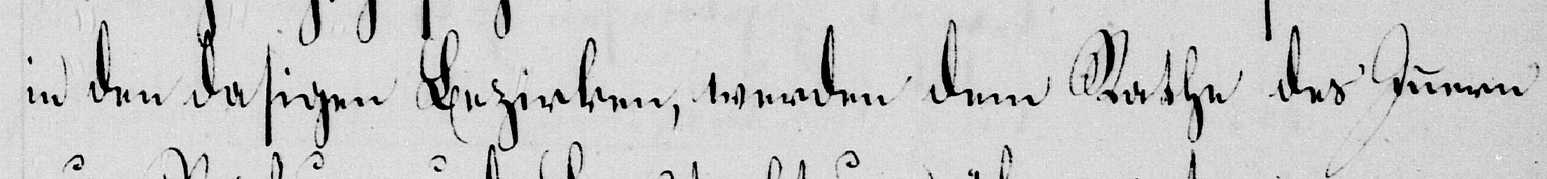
in den dasigen Bezirken, wurden dem Rathe des Innern
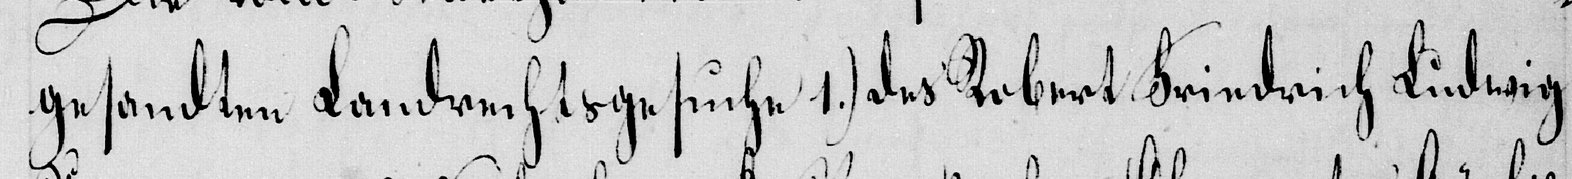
gesandten Landrechtsgesuche 1.) des Robert Friedrich Ludwig
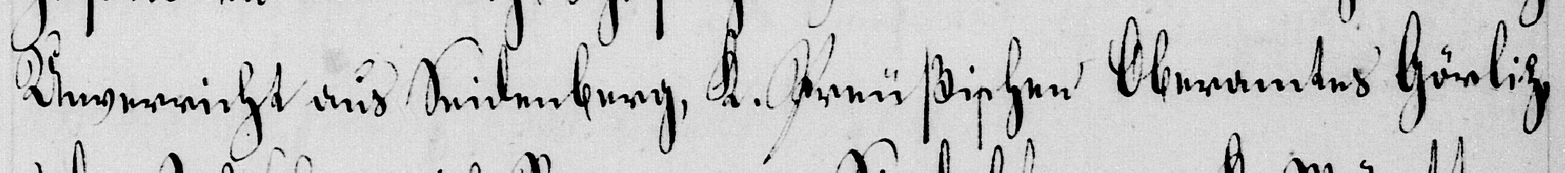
Unverricht aus Seidenberg, K. Preußischen Oberamtes Görliz,
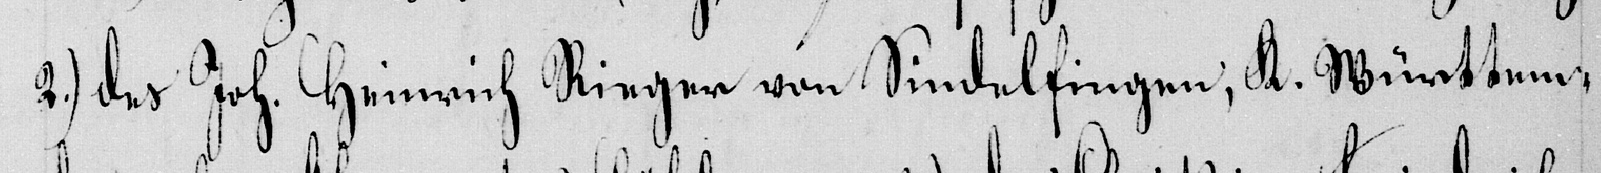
2.) des Joh. Heinrich Rieger von Sindelfingen, K. Württem¬
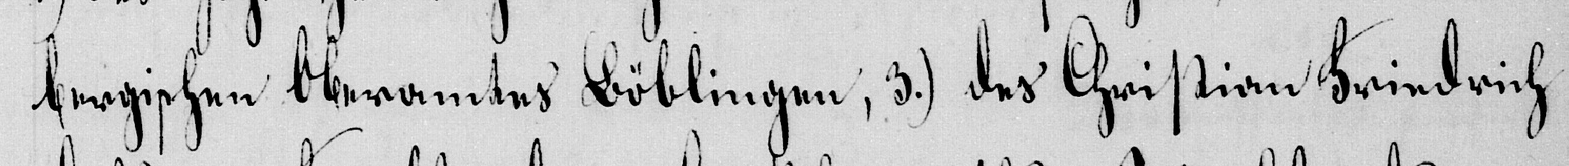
bergischen Oberamtes Böblingen, 3.) des Christian Friedrich
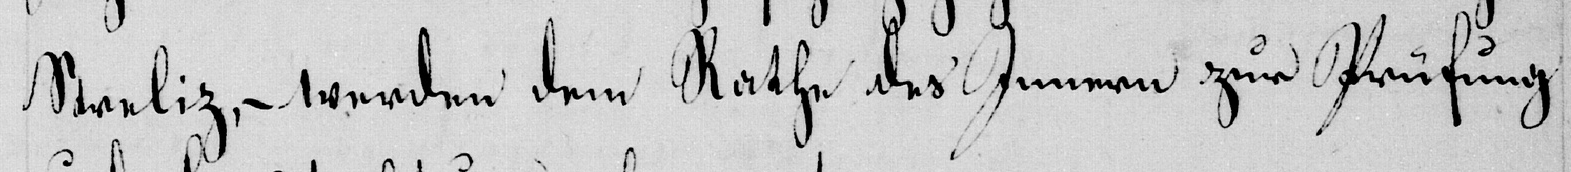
treliz, – werden dem Rathe des Innern zur Prüfung
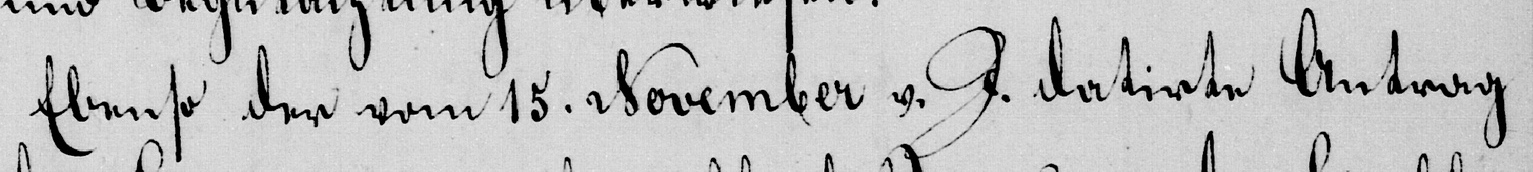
Ebenso der vom 15. November v. J. datirte Antrag
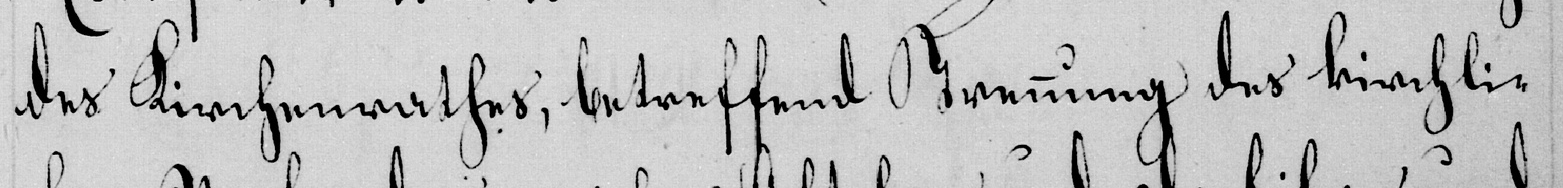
des Kirchenrathes, betreffend Trennung des kirchli¬
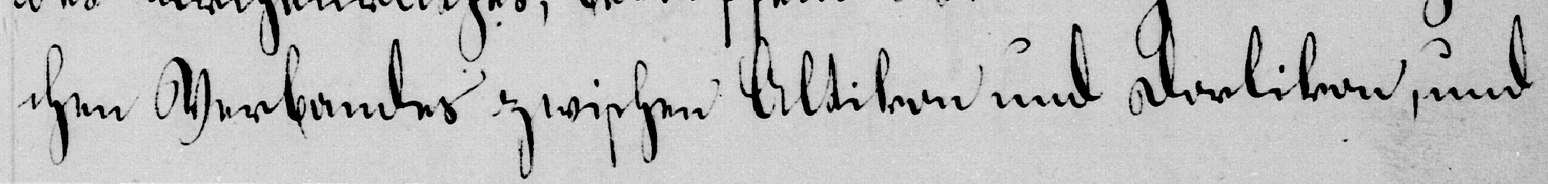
chen Verbandes zwischen Altikon und Dorlikon, und
